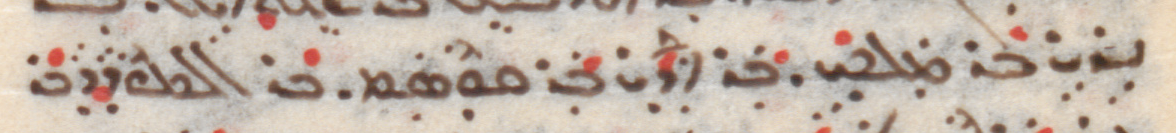ܢܪܝ ܒܪ ܡܠܟܝ. ܒܪ ܐܕܝ ܒܪ ܩܘܣܡ. ܒܪ ܐܠܡܘܕܕ ܒܪ
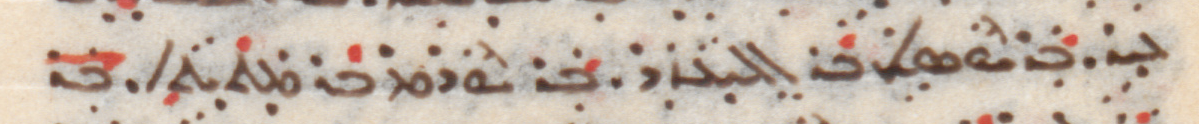ܥܝܪ. ܒܪ ܝܘܣܐ ܒܪ ܐܠܝܥܙܪ. ܒܪ ܝܘܪܡ ܒܪ ܡܬܝܬܐ ܒܪ
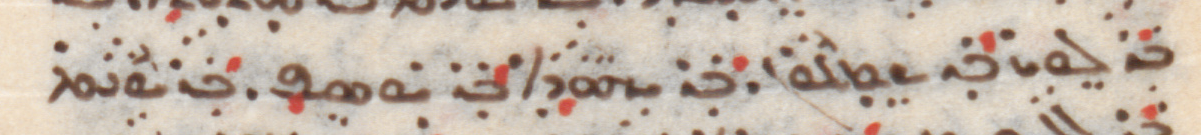ܒܪ ܠܘܝ ܒܪ ܫܡܥܘܢ. ܒܪ ܝܗܘܕܐ ܒܪ ܝܘܣܦ. ܒܪ ܝܘܢܡ
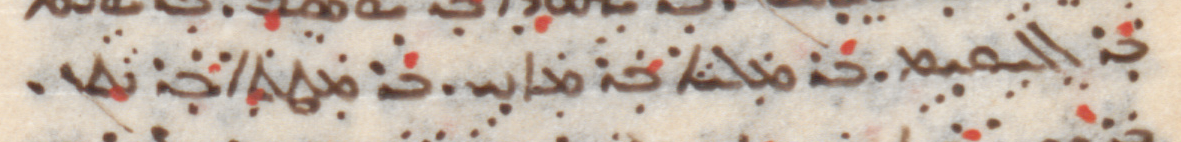ܒܪ ܐܠܝܩܝܡ. ܒܪ ܡܠܝܐ ܒܪ ܡܐܢܝ. ܒܪ ܡܛܬܐ ܒܪ ܢܬܢ.
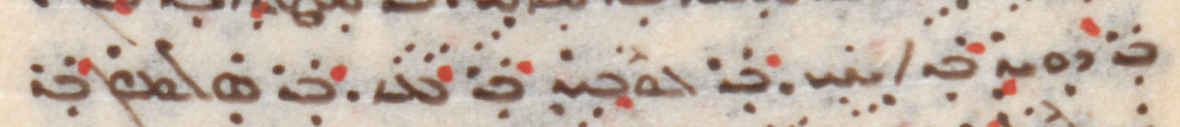ܒܪ ܕܘܝܕ ܒܪ ܐܝܫܝ. ܒܪ ܥܘܒܝܕ ܒܪ ܒܥܙ. ܒܪ ܣܠܡܘܢ ܒܪ
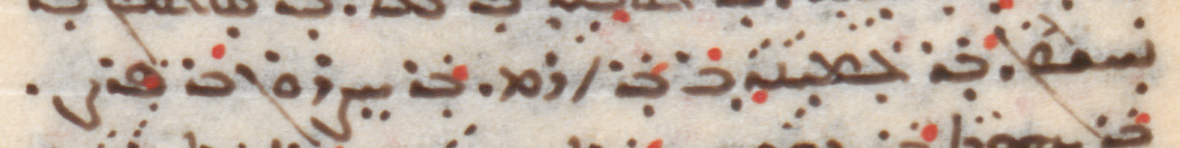ܢܚܫܘܢ. ܒܪ ܥܡܝܢܕܒ ܒܪ ܐܪܡ. ܒܪ ܚܨܪܘܢ ܒܪ ܦܪܨ.
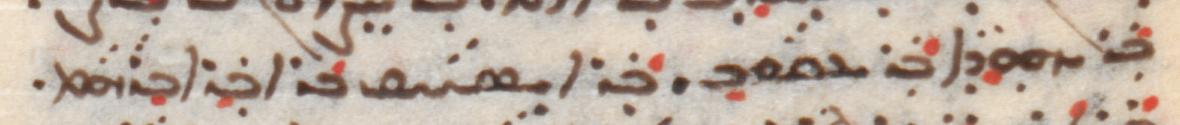ܒܪ ܝܗܘܕܐ ܒܪ ܝܥܩܘܒ. ܒܪ ܐܝܣܚܩ ܒܪ ܐܒܪܗܡ.
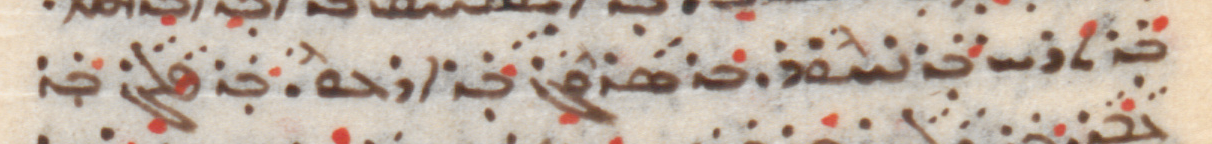ܒܪ ܬܪܚ ܒܪ ܢܚܘܪ. ܒܪ ܣܪܘܓ ܒܪ ܐܪܥܘ. ܒܪ ܦܠܓ ܒܪ
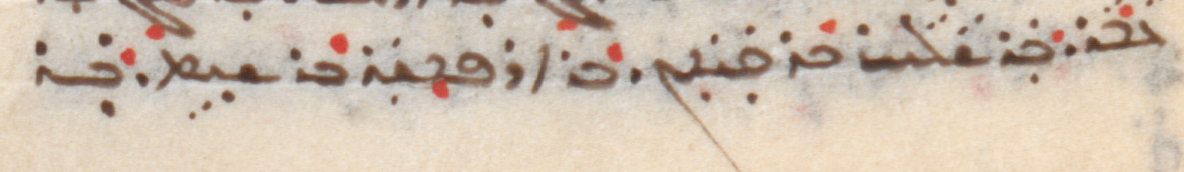ܥܒܪ. ܒܪ ܫܠܚ ܒܪ ܩܝܢܢ. ܒܪ ܐܪܦܟܫܪ ܒܪ ܫܝܡ. ܒܪ
